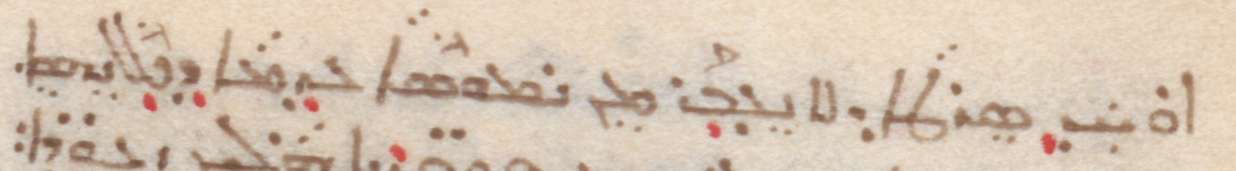ܐܘ ܚܕ ܣܪܛܐ܆ ܠܐ ܢܥܒ̣ܪ ܡ̣ܢ ܢܡܘܣܐ ܥܕܡܐ ܕܟܠ ܢܗܘܐ.
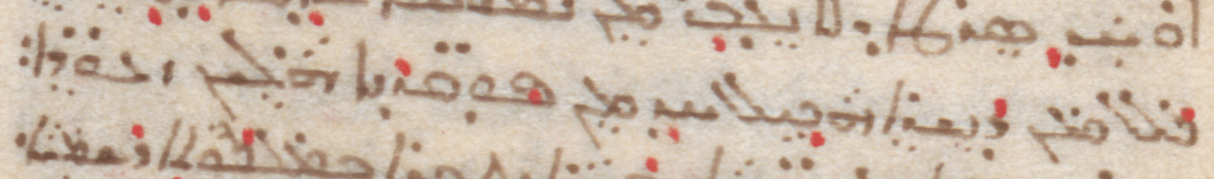ܟܠ ܡܢ ܗܟܝܠ ܕܢܫܪܐ ܚܕ ܡ̣ܢ ܦܘܩ̈ܕܢܐ ܗܠܝܢ ܙܥܘܪ̈ܐ:
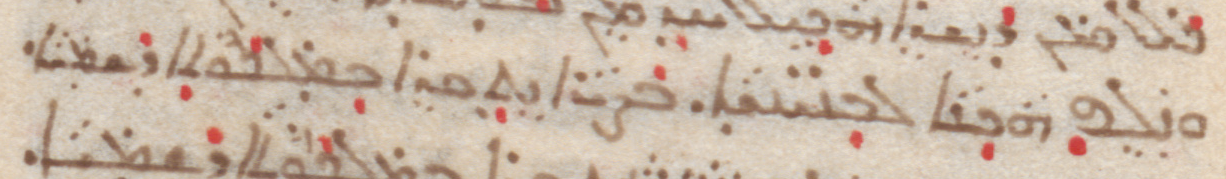ܘܢܠܦ ܗܟܢܐ ܠܒܢܝ̈ܢܫܐ ܒܨܝܪܐ ܢܬܩܪܐ ܒܡܠܟܘܬܐ ܕܫܡܝܐ
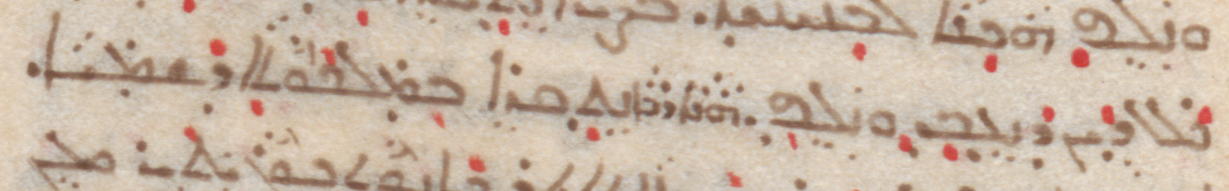ܟܠ ܕܝܢ ܕܢܥ̣ܒܕ ܘܢܠܦ ܗܢܐ ܪܒܐ ܢܬܩܪܐ ܒܡܠܟܘܬܐ ܕܫܡܝܐ.
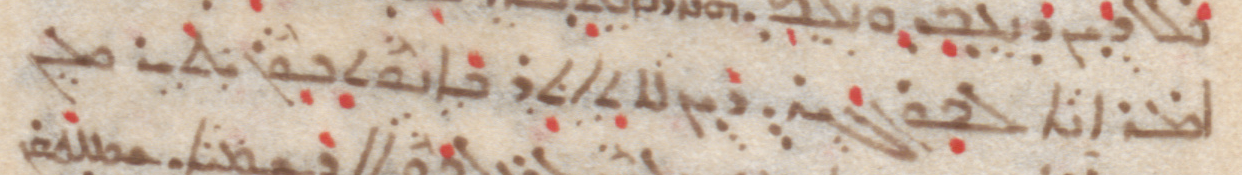ܐܡ̇ܪ ܐܢܐ ܠܟܘܢ ܓܝܪ: ܕܐܠܐ ܬܐܬܪ ܟܐܢܘܬܟܘܢ ܝܬܝܪ ܡܢ
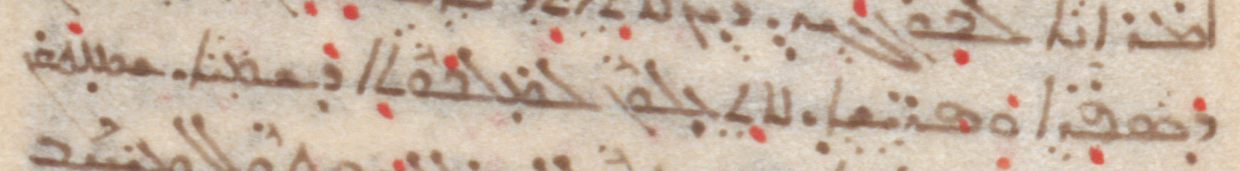ܕܣܦܪ̈ܐ ܘܦܪ̈ܝܫܐ. ܠܐ ܬܥܠܘܢ ܠܡܠܟܘܬܐ ܕܫܡܝܐ. ܫܡܥܬܘܢ
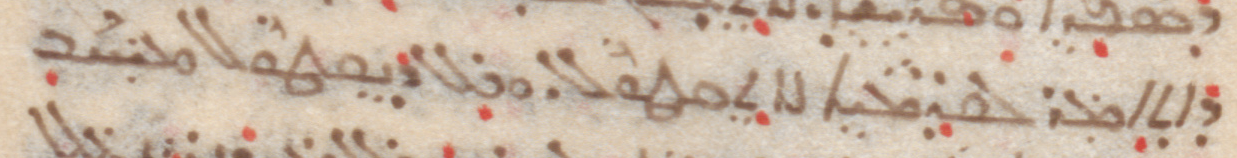ܕܐܬ̣ܐܡܪ ܠܩܕܡ̈ܝܐ ܠܐ ܬܩܛܘܠ. ܘܟܠ ܕܢܩܛܘܠ ܡܚܝܒ
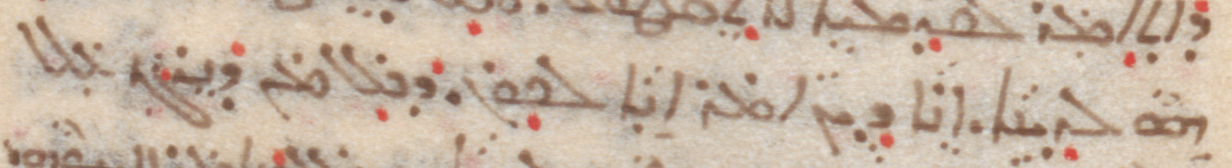ܗܘ ܠܕܝܢܐ ܐܢܐ ܕܝܢ ܐܡ̇ܪ ܐܢܐ ܠܟܘܢ. ܕܟܠ ܡ̇ܢ ܕܢܪܓܙ ܥܠ
